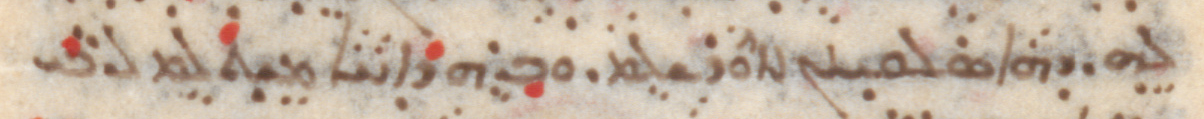ܠܗ. ܕܗܐ ܣܠܩܝܢܢ ܠܐܘܪܫܠܡ. ܘܒܪܗ ܕܐܢܫܐ ܡܫܬܠܡ ܠܪ̈ܒܝ
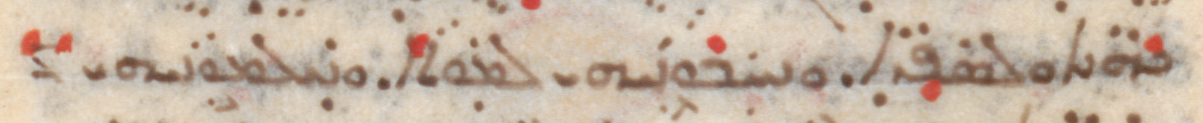ܟܗ̈ܢܐ ܘܠܣܦܪ̈ܐ܆ ܘܢܚܝܒܘܢܝܗܝ ܠܡܘܬܐ. ܘܢܫܠܡܘܢܝܗܝ ܏ܠ
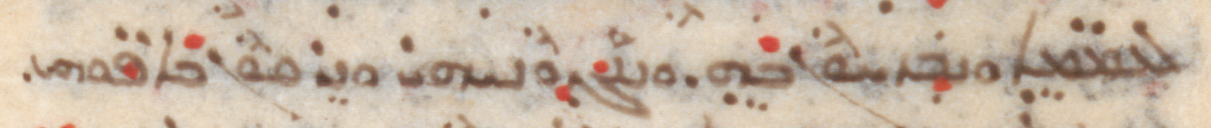ܠܥܡ̈ܡܐ ܘܢܒܙܚܘܢ ܒܗ܆ ܘܢܢܓܕܘܢܝܗܝ ܘܢܪܩܘܢ ܒܐܦ̈ܘܗܝ.
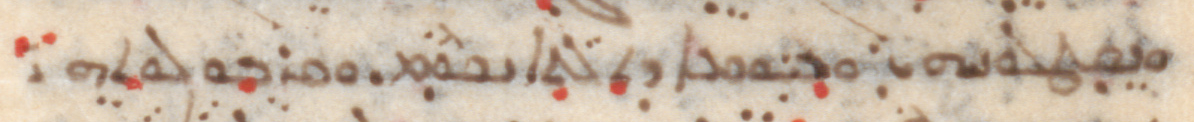ܘܢܩܛܠܘܢܝܗܝ: ܘܒܝܘܡܐ ܕܬܠܬܐ ܢܩܘܡ. ܘܩܪܒܘ ܠܘܬܗ ܏ܝ
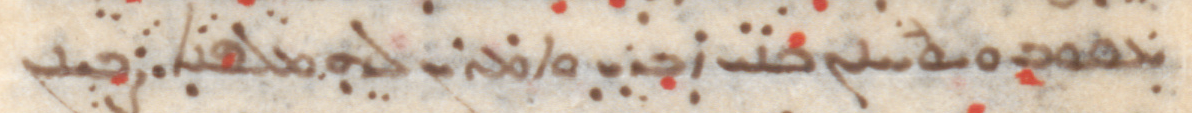ܝܥܩܘܒ ܘܝܘܚܢܢ ܒܢ̈ܝ ܙܒܕܝ ܘܐܡ̇ܪܝܢ ܠܗ ܡܠܦܢܐ܆ ܨ̇ܒܝܢܢ
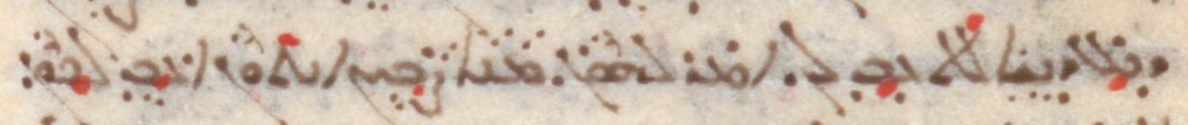ܕܟܠ ܕܢܫܐܠ ܬܥܒܕ ܠܢ. ܐܡ̇ܪ ܠܗܘܢ܇ ܡܢܐ ܨ̇ܒܝܢ ܐܢܬܘܢ ܐܥ̇ܒܕ ܠܟܘܢ.
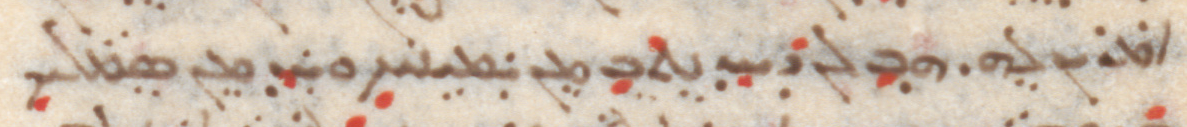ܐܡ̇ܪܝܢ ܠܗ. ܗܒ ܠܢ ܕܚܕ ܢܬܒ ܡܢ ܝܡܝܢܟ ܘܚܕ ܡܢ ܣܡܠܟ
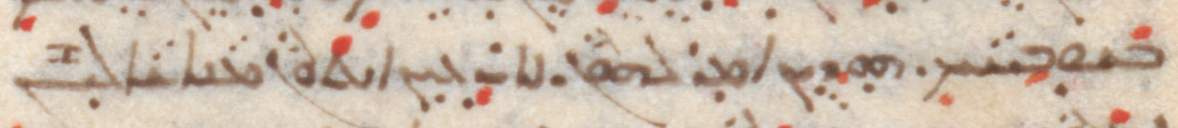ܒܫܘܒܚܟ. ܗ̣ܘ ܕܝܢ ܐܡ̣ܪ ܠܗܘܢ. ܠܐ ܝ̇ܕܥܝܢ ܐܢܬܘܢ ܡܢܐ ܫܐܠܝܢ
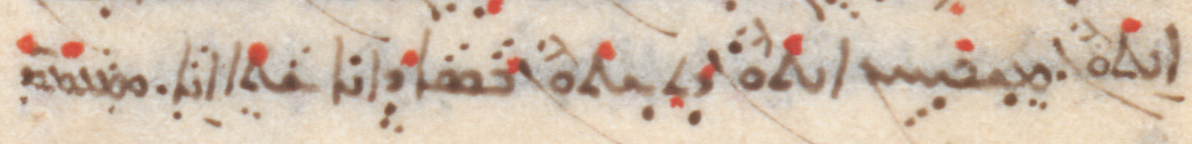ܐܢܬܘܢ. ܡܫܟܚܝܢ ܐܝܬܘܢ ܕܬܫܬܘܢ ܟܣܐ ܕܐܢܐ ܫܬܐ ܐܢܐ. ܘܡܥܡ܏ܘܕ
